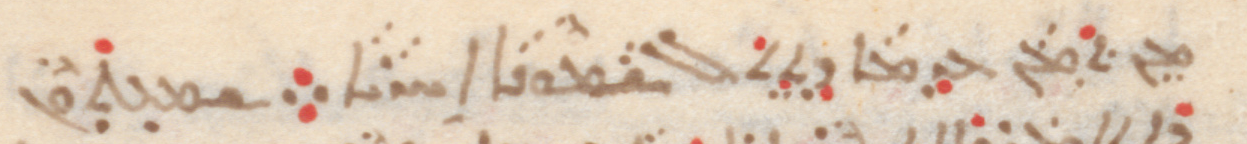ܡܢ ܬܡܢ ܥܕܡܐ ܕܬܬܠ ܫܡܘܢܐ ܐܚܪܝܐ܀ ܫܡܥܬܘܢ
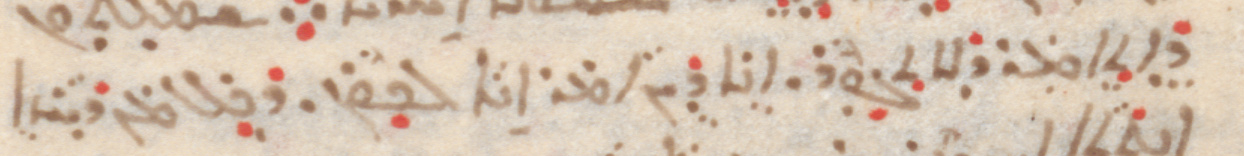ܕܐܬܐܡܪ ܕܠܐ ܬܓܘܪ. ܐܢܐ ܕܝܢ ܐܡ̇ܪ ܐܢܐ ܠܟܘܢ. ܕܟܠ ܡ̇ܢ ܕܚ̇ܙܐ
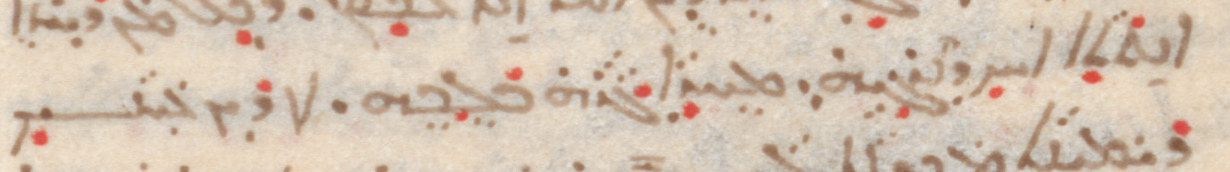ܐܢܬܬܐ ܐܝܟ ܕܢܪ̈ܓܝܗ̇܆ ܡܚܕܐ ܓܪܗ̇ ܒܠܒܗ. ܐܢܪܢ ܥܝܢܟ
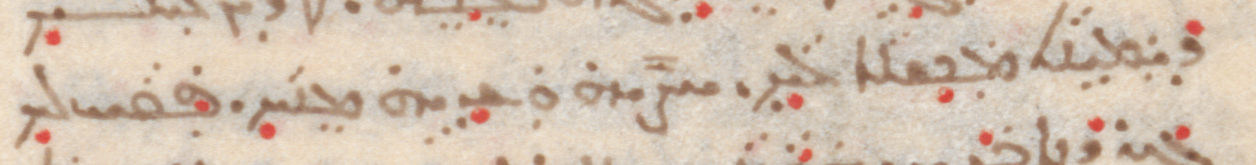ܕܝܡܝܢܐ ܡܟܫܠܐ ܠܟ܆ ܚܨܝܗ̇ ܘܫܕܝܗ̇ ܡܢܟ. ܦܩܚ ܠܟ
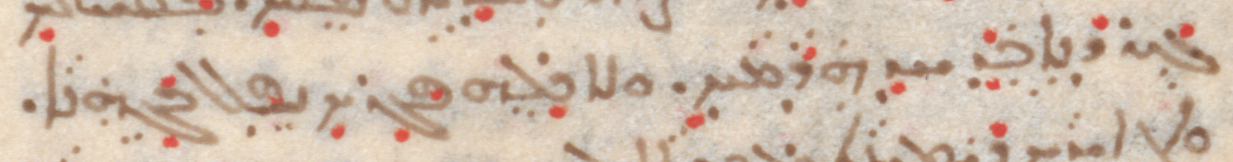ܓܝܪ ܕܢܐܒܕ ܚܕ ܗܕܡܟ܆ ܘܠܐ ܟܠܗ ܦܓܪܟ ܢܦ̣ܠ ܒܓܗܢܐ.
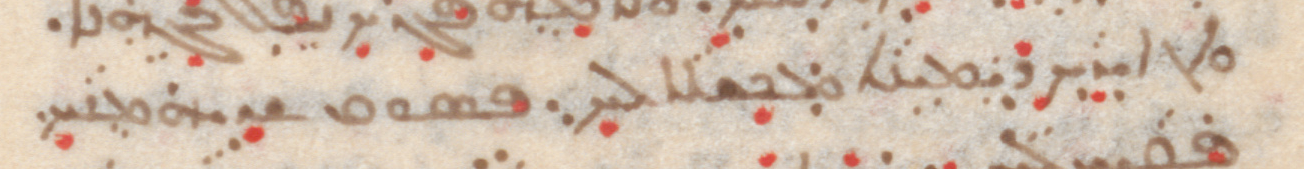ܘܐܢ ܐܝܕܟ ܕܝܡܝܢܐ ܡܟܫܠܐ ܠܟ܆ ܦܣܘܩ ܫܕܝܗ̇ ܡܢܟ.
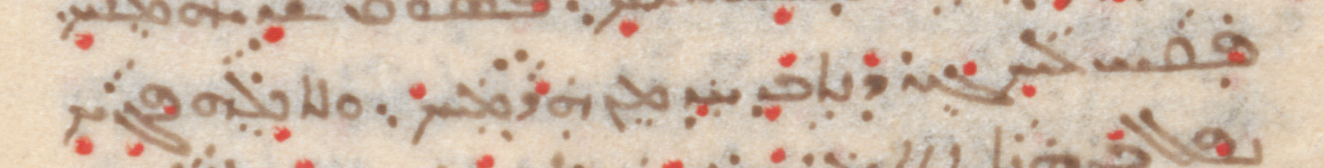ܦܩܚ ܠܟ ܓܝܪ ܕܢܐܒܕ ܚܕ ܡܢ ܗܕܡ̈ܝܟ܆ ܘܠܐ ܟܠܗ ܦܓܪܟ
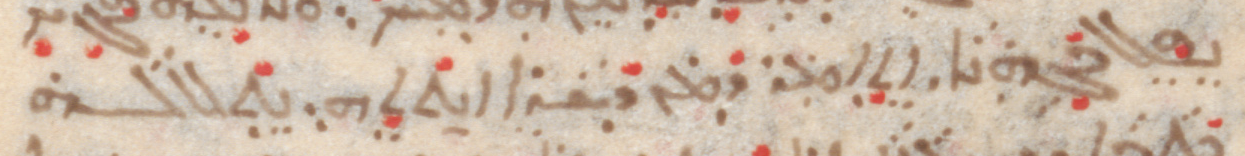ܢܦܠ ܒܓܗܢܐ. ܐܬܐܡܪ ܕܡ̇ܢ ܕܫܪܐ ܐܢܬܬܗ ܢܬܠ ܠܗ̇
